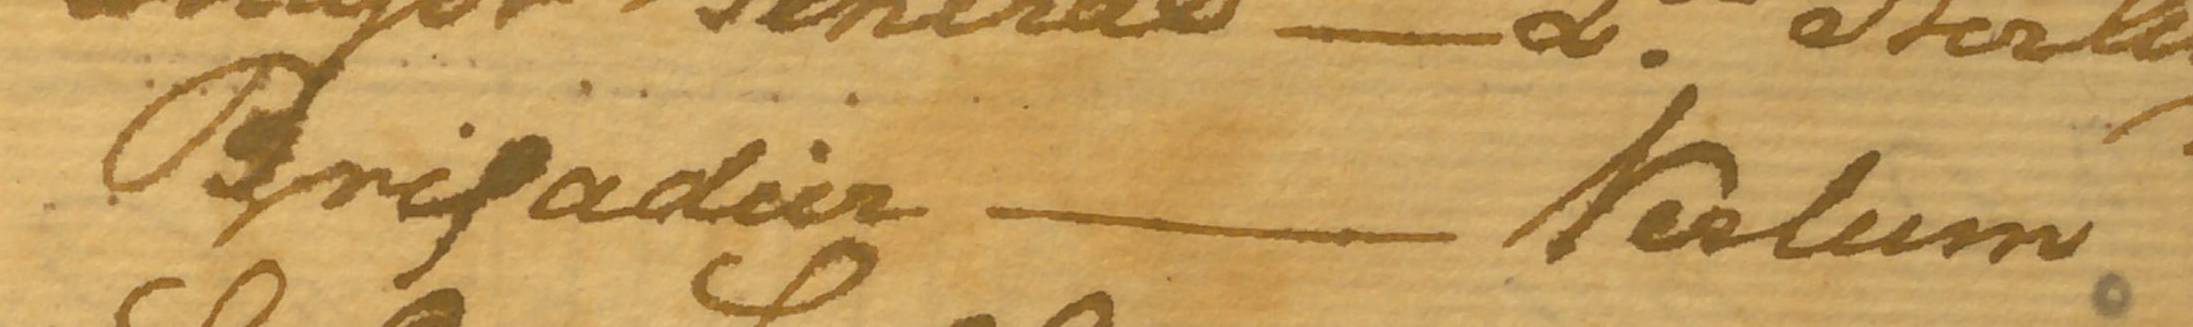Brigadier- Verlum
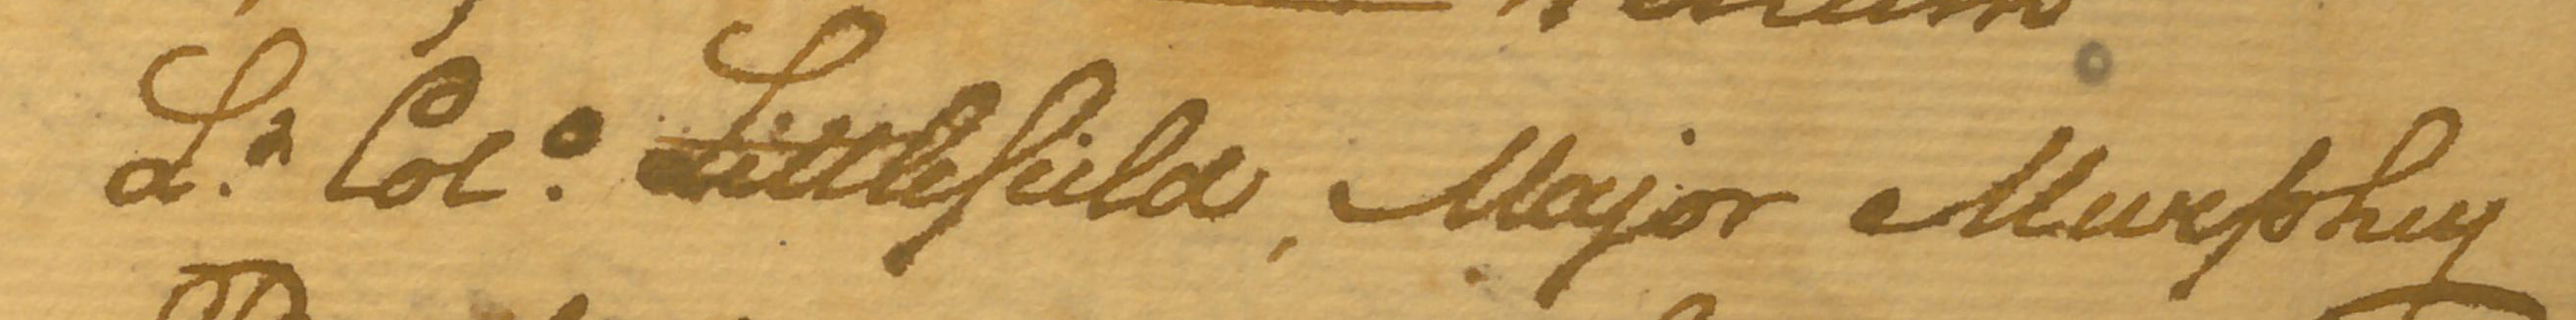L^t. Col^o. Littlefeild, Major Murphy
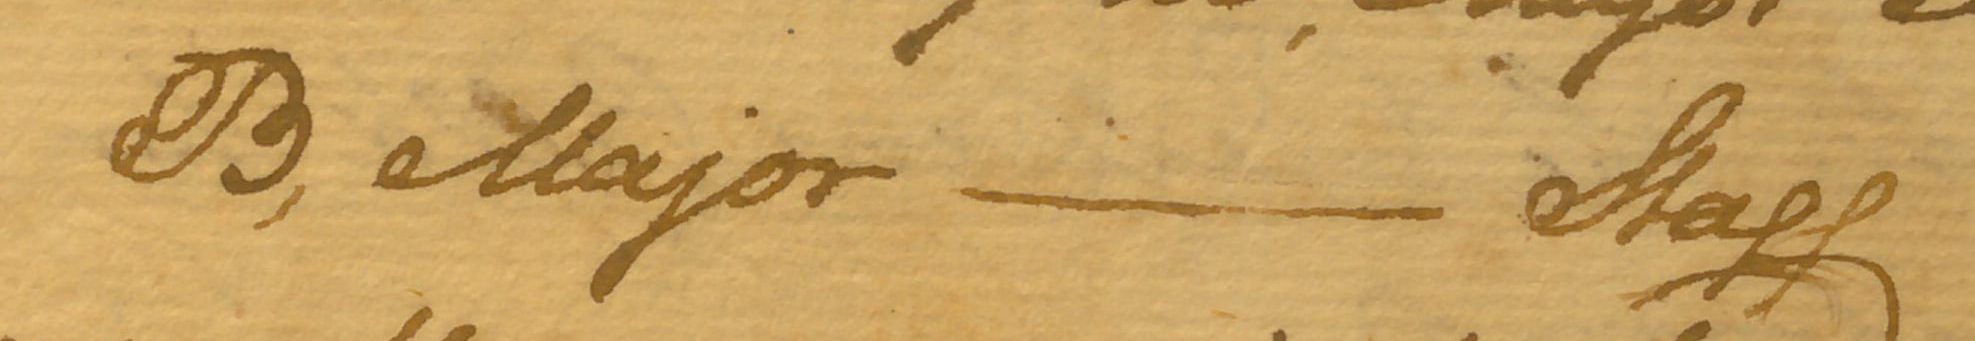B. Major- Stagg
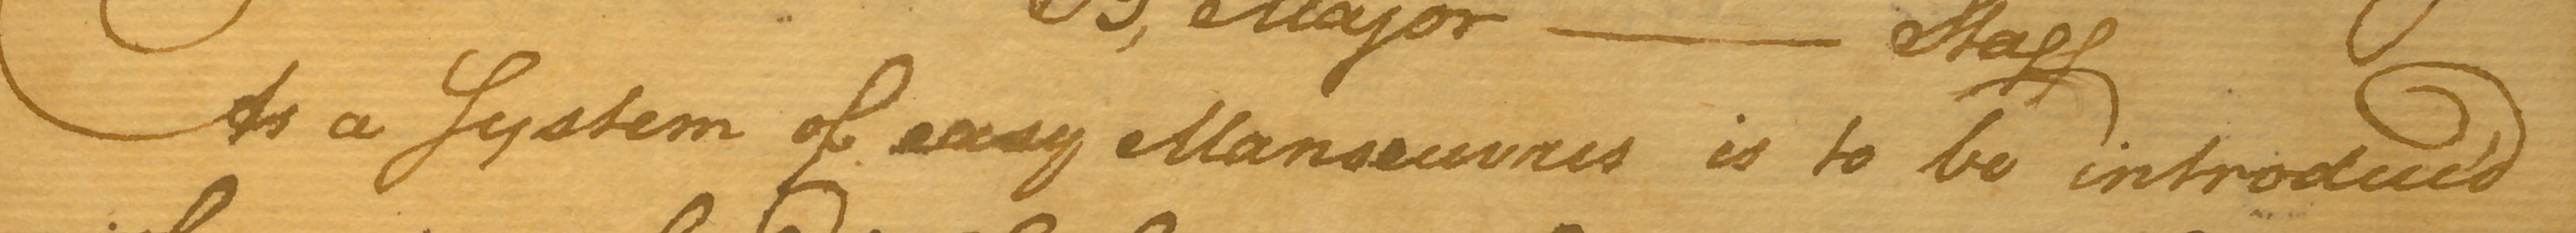As a System of easy Manseuvres is to be introduc'd
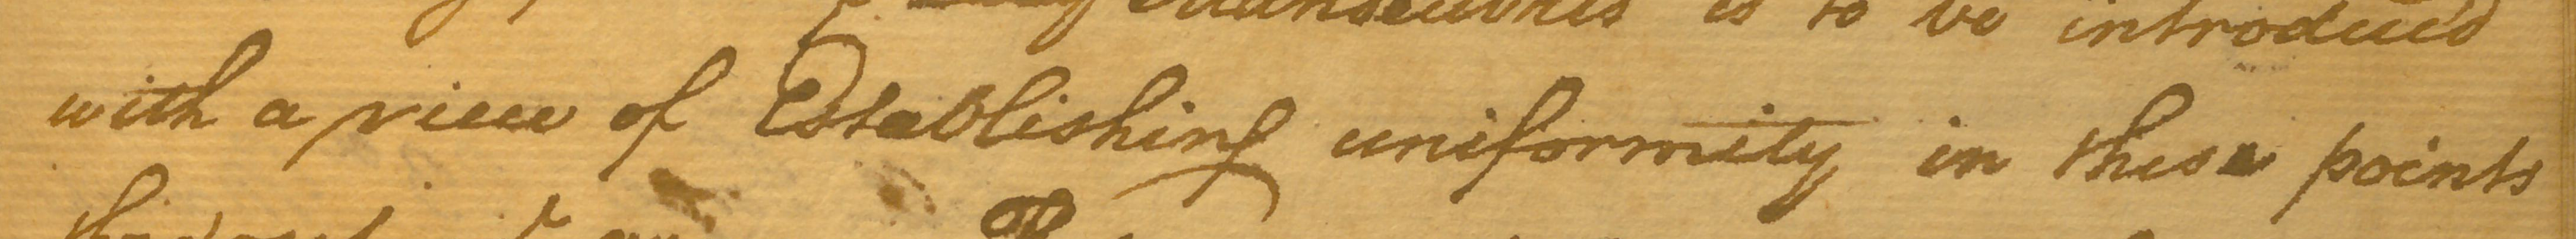with a view of Establishing uniformity in these points
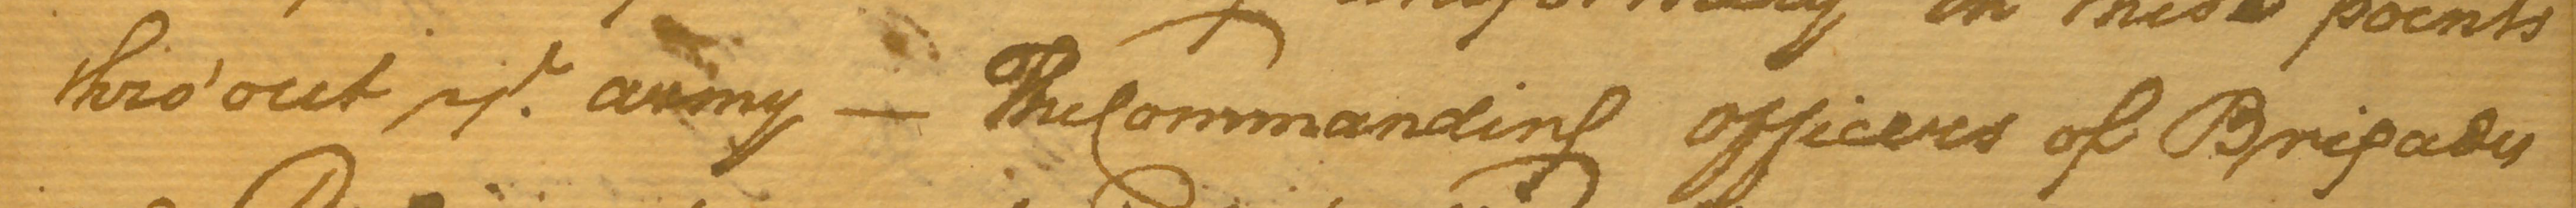thro'out y^e. army- Recommanding Officers of Brigades
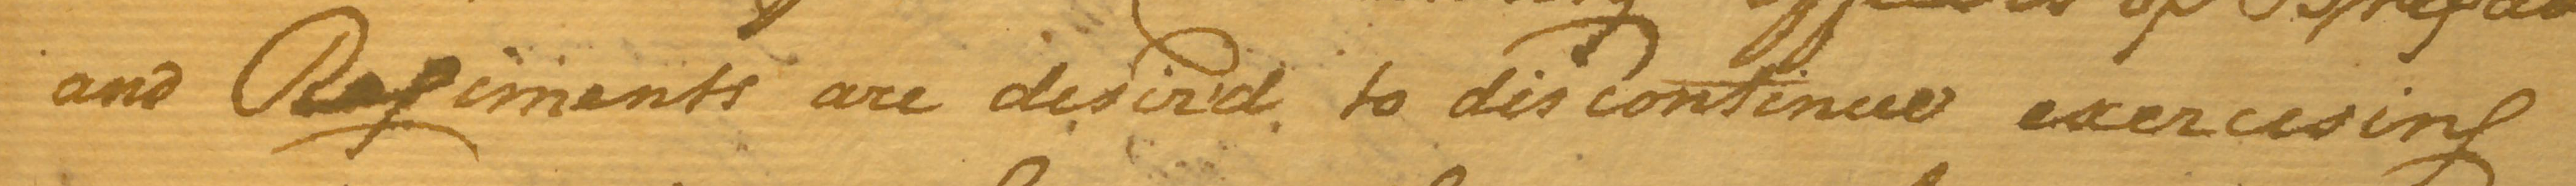and Regiments are desir'd to discontinue exercising
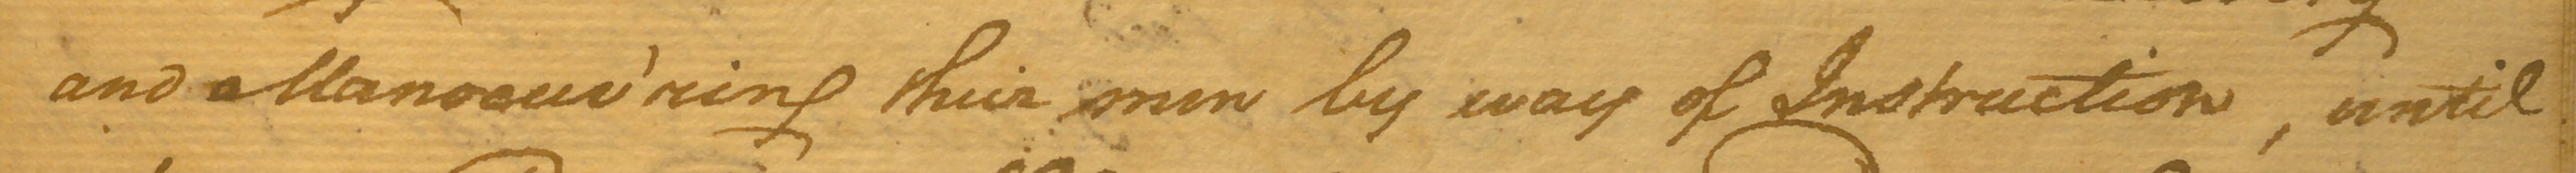and Manoeuv'ring their men by way of Instruction, until
